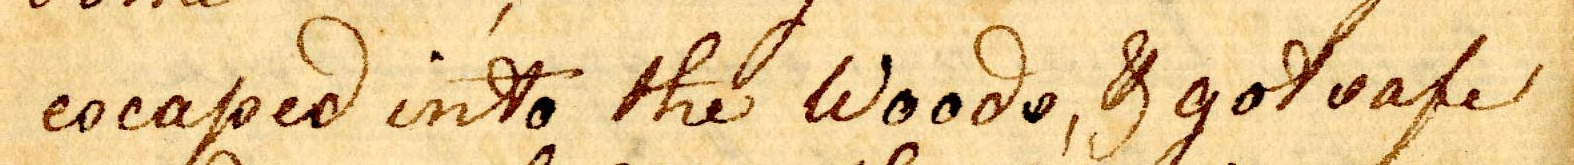escaped into the Woods, & got safe
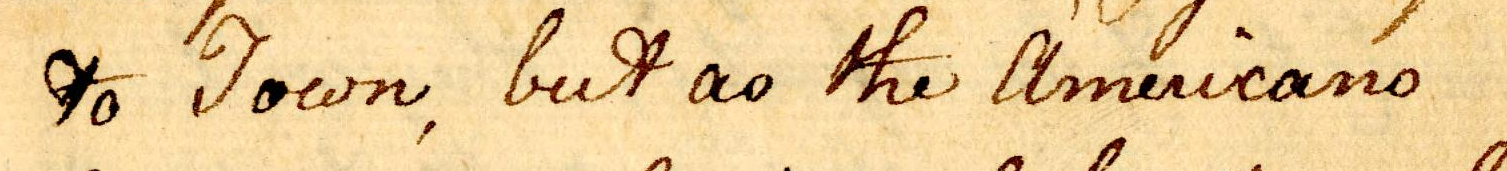to Town, but as the Americans
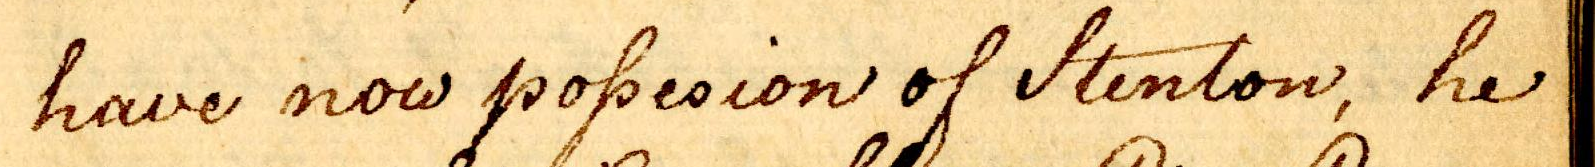have now possesion of Stenton, he
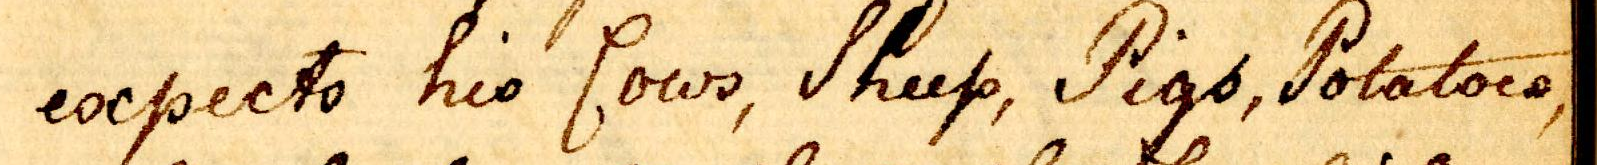expects his Cows, Sheep, Pigs, Potatoes
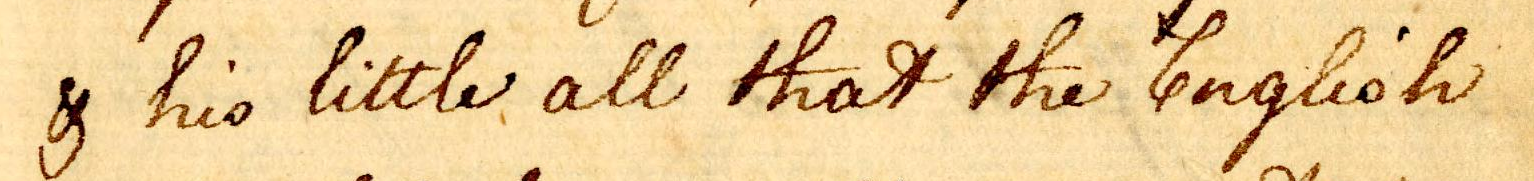& his little all that the English
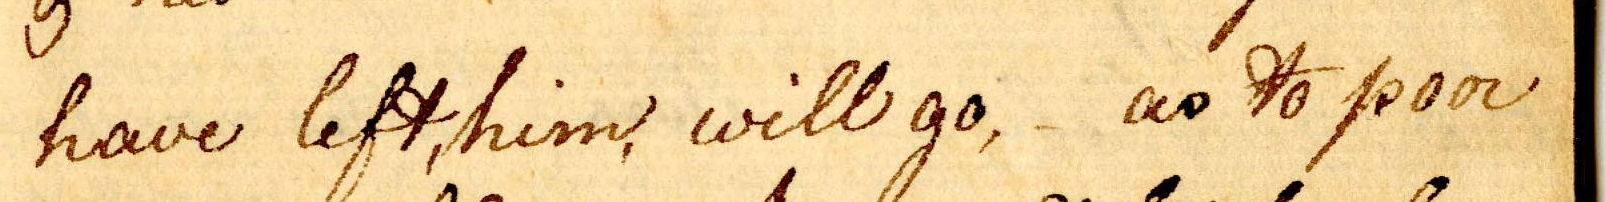have left him, will go as to poor
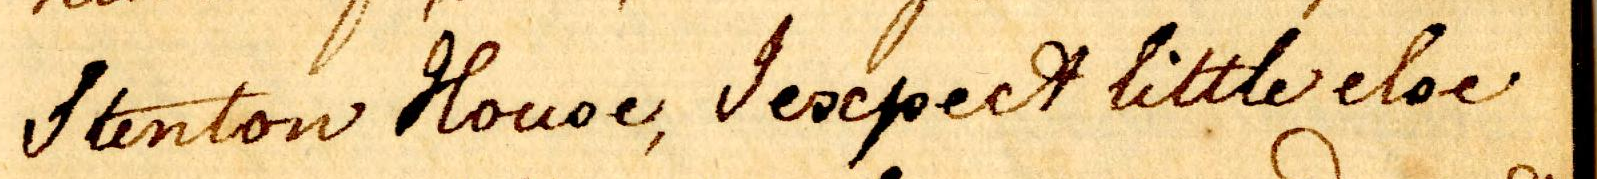Stenton House, I expect little else
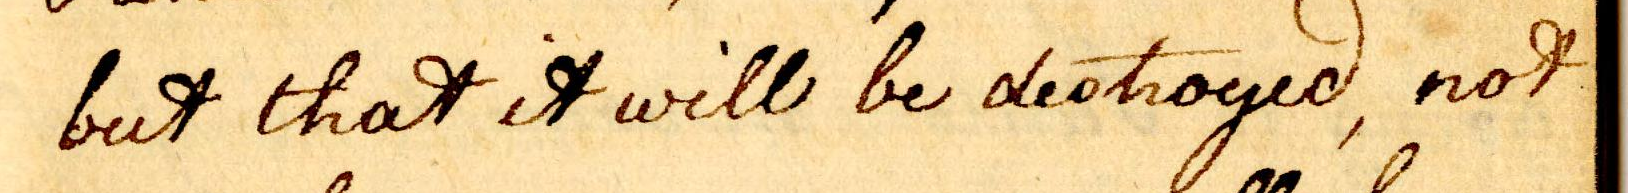but that it will be destroyed, not
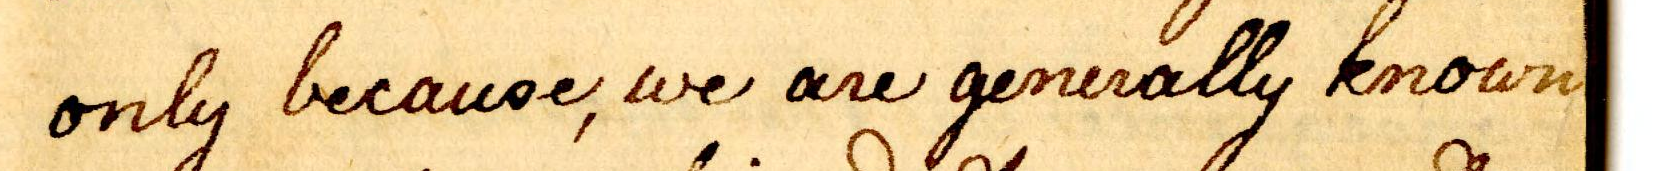only because, we are generally known
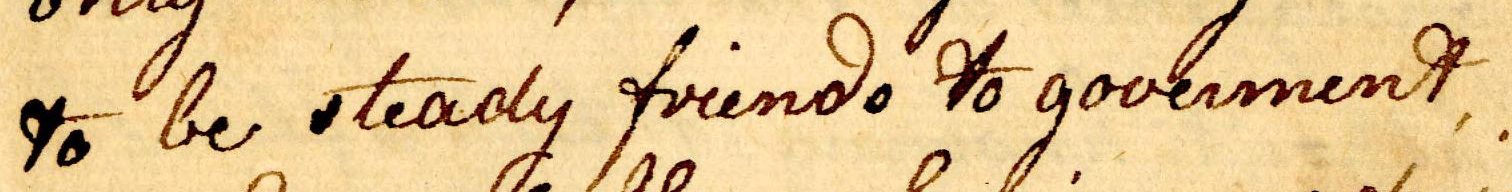to be steady friends to goverment
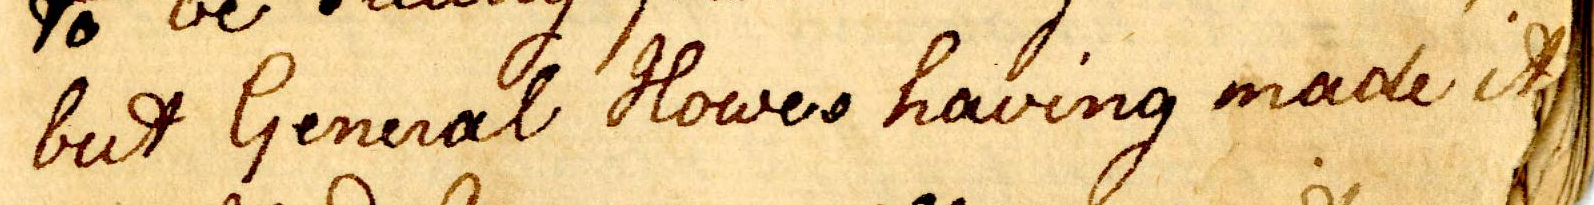but General Howes having made it
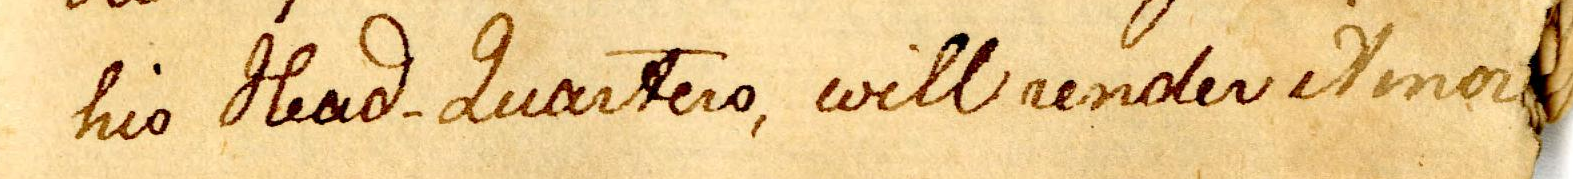his Head-Quarters, will render it mor
